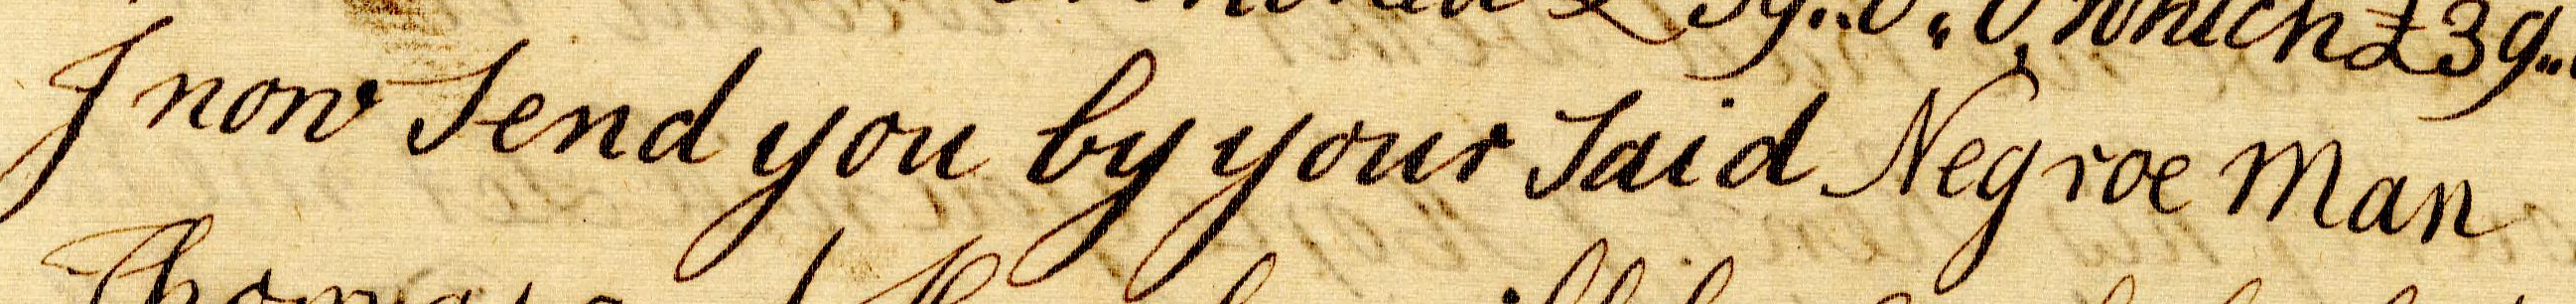I now Send you by your Said Negroe Man
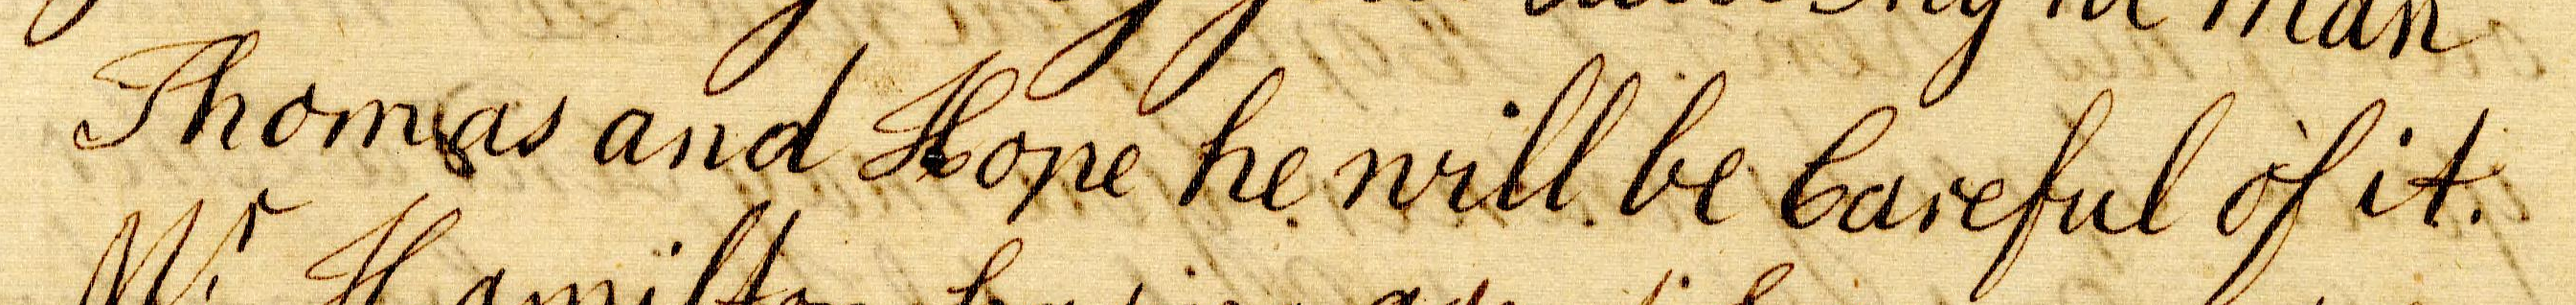Thomas and Hope he will be careful of it.
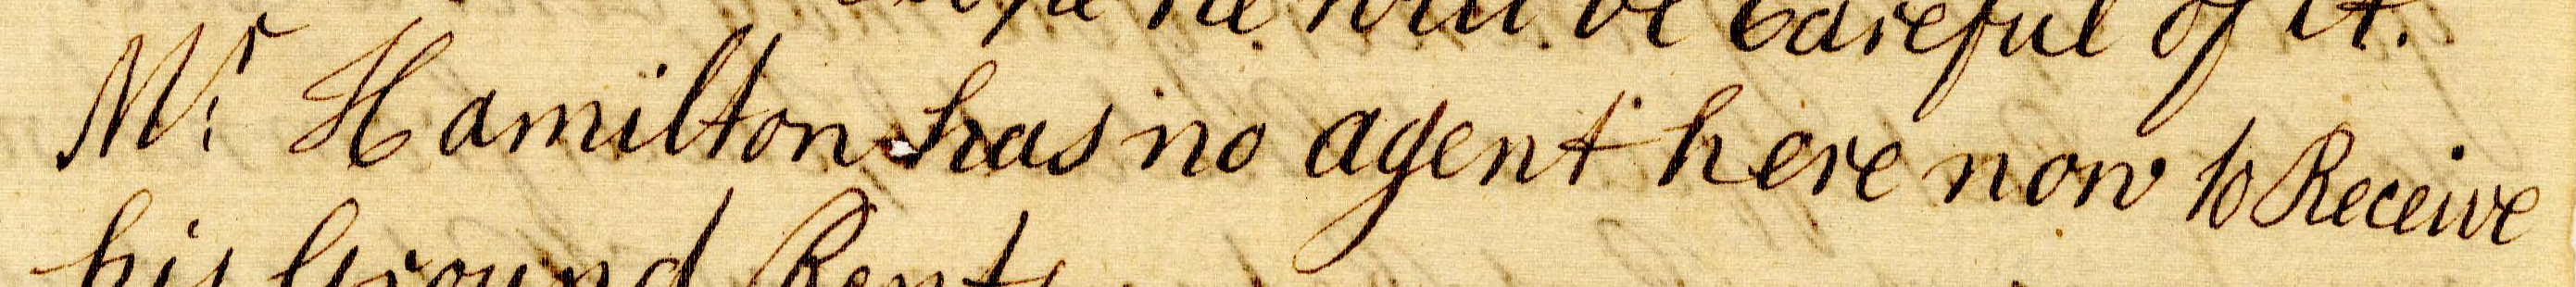M^r: Hamilton has no agent here now to Receive
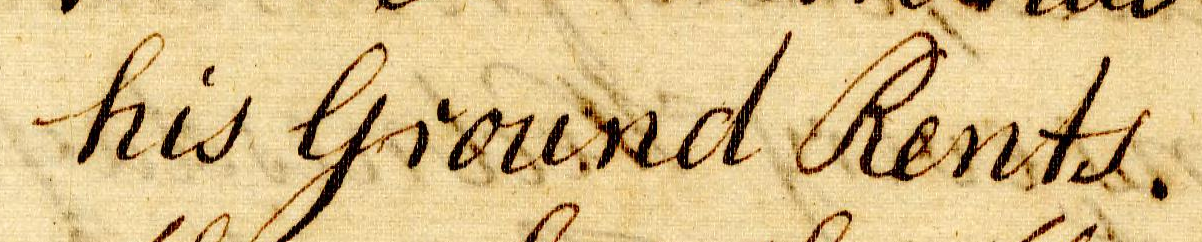his Ground Rents.
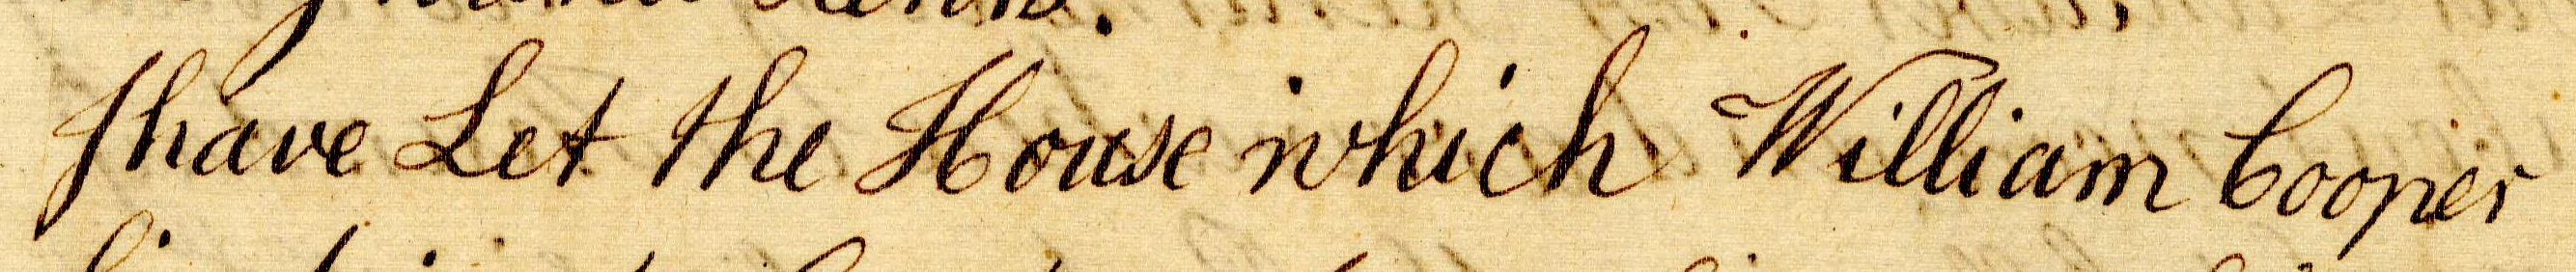I have Let the House which William Cooper
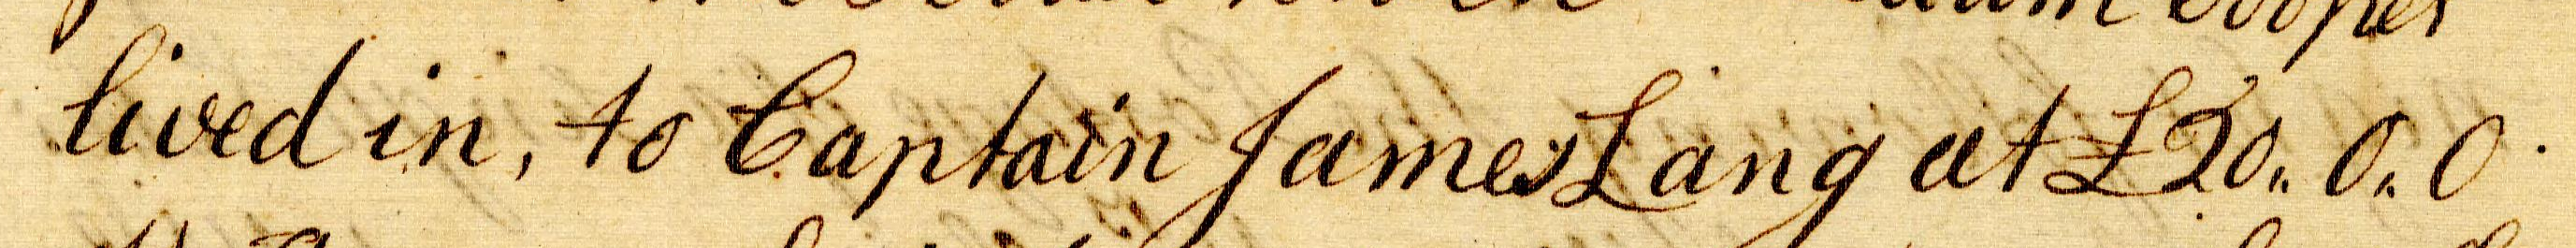lived in, to Captain James Lang at £20..0..0
